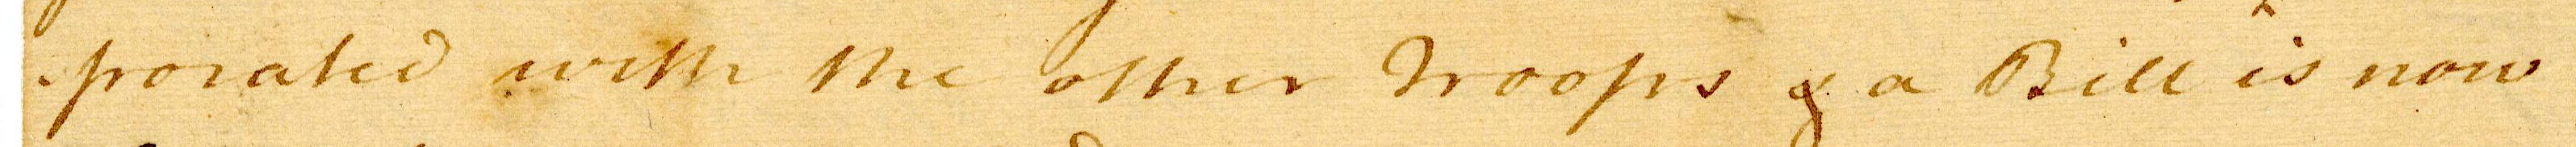porated with the other troops & a Bill is now
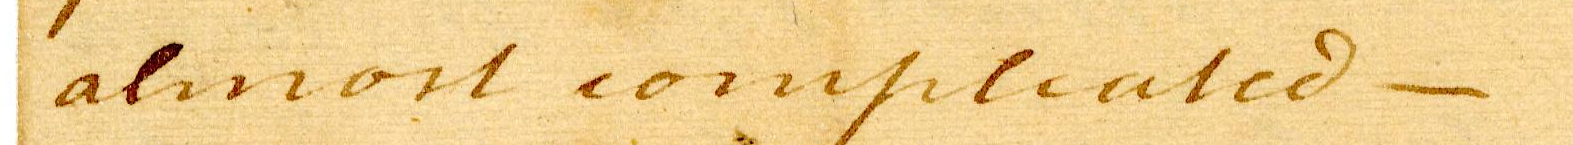almost compleated-
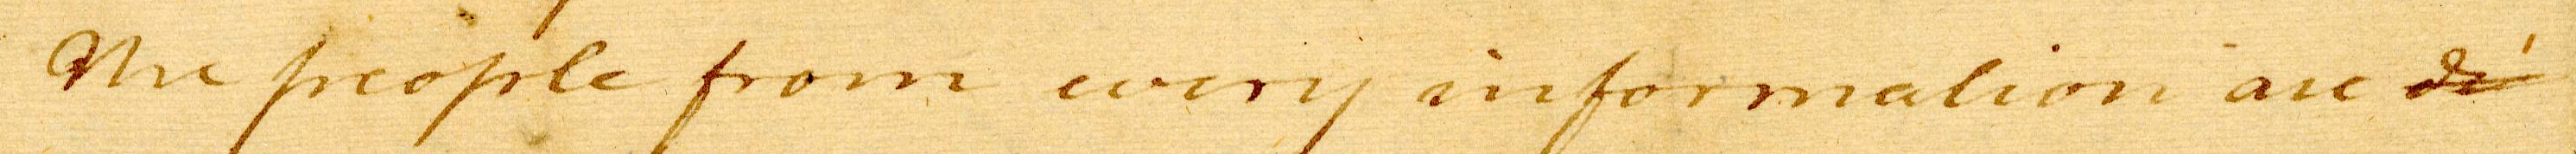the people from every information are [di]
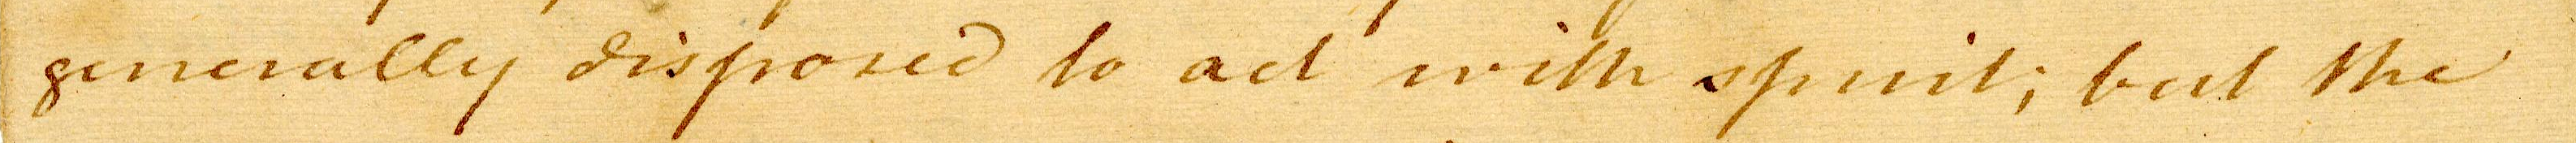generally disposed to act with spirit; but the
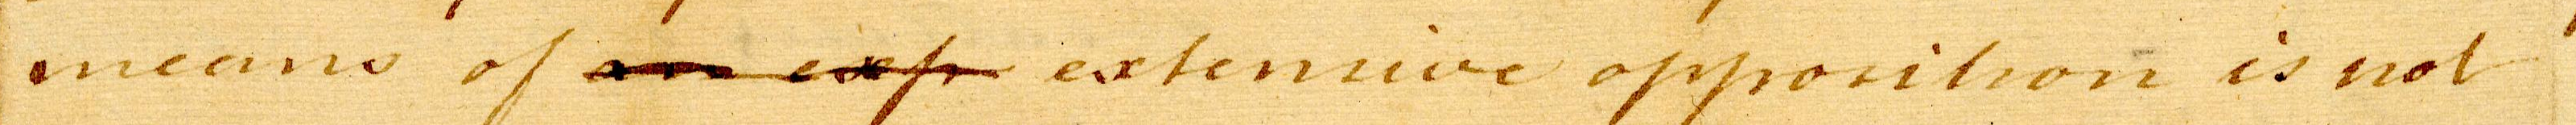means of [an exp] extensive opposition is not
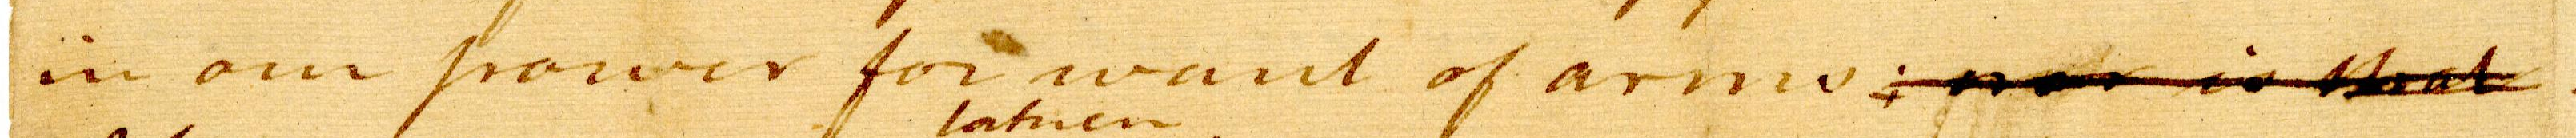in our power for want of arms; [nor is that]
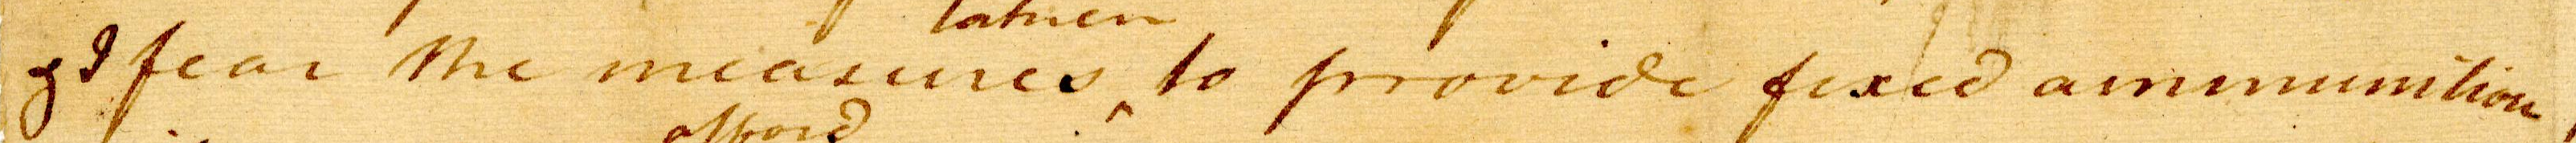y^d fear the measures ^ to provide fixed ammunition
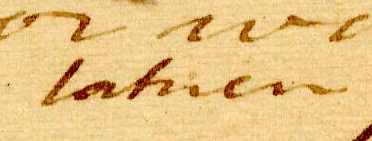taken
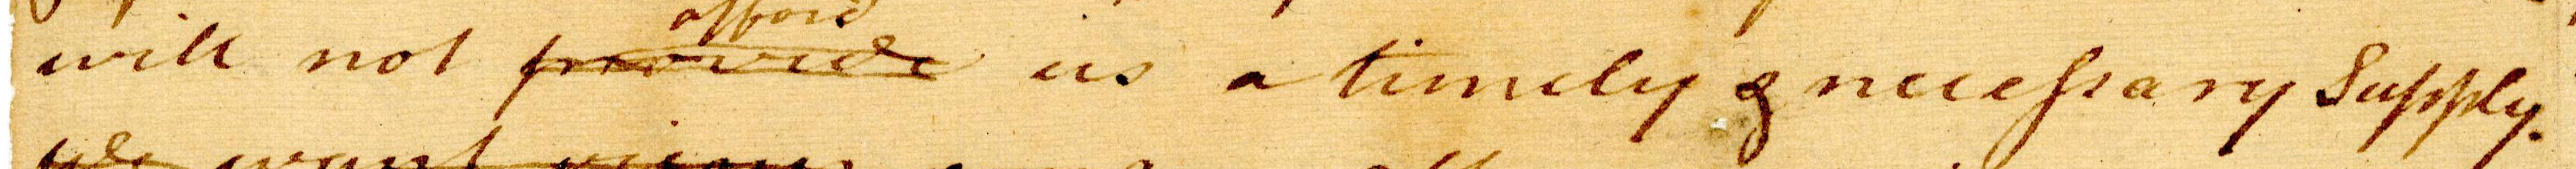will not [provide] us a timely a necessary Supply.
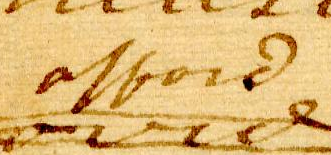afford
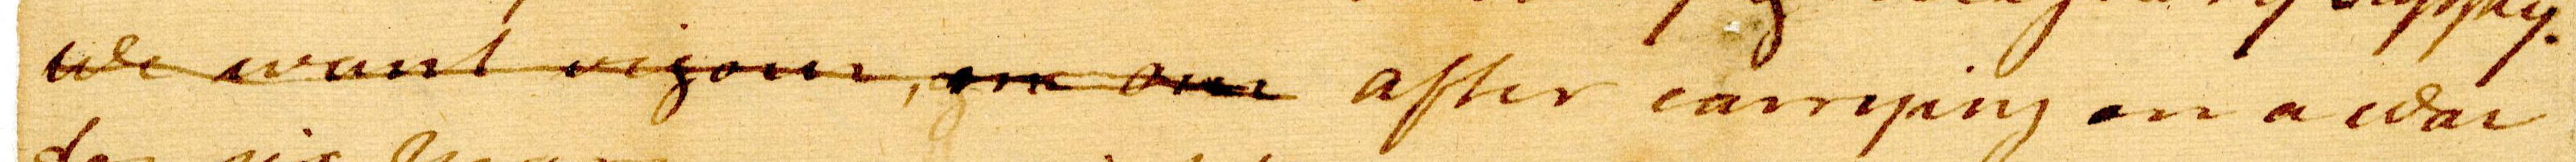[We want vigour, on our] after carrying on a war
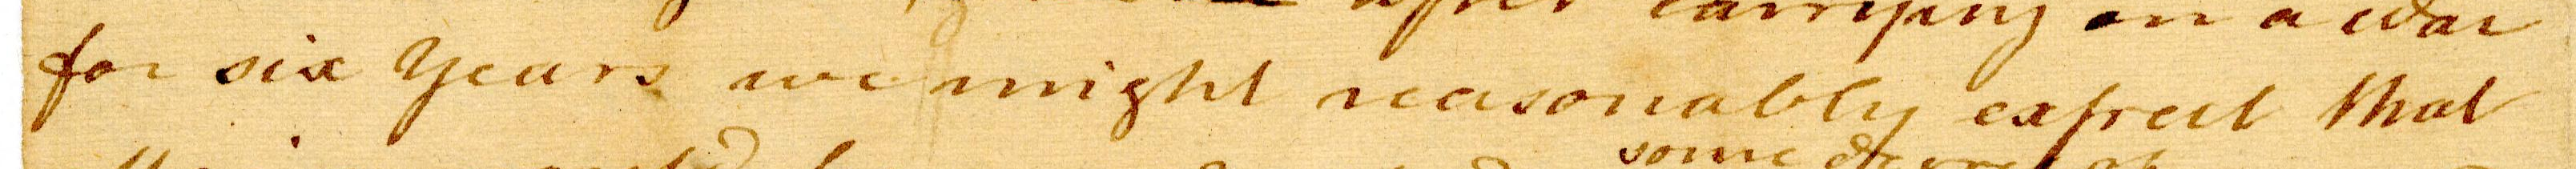for six years we might reasonably expect that
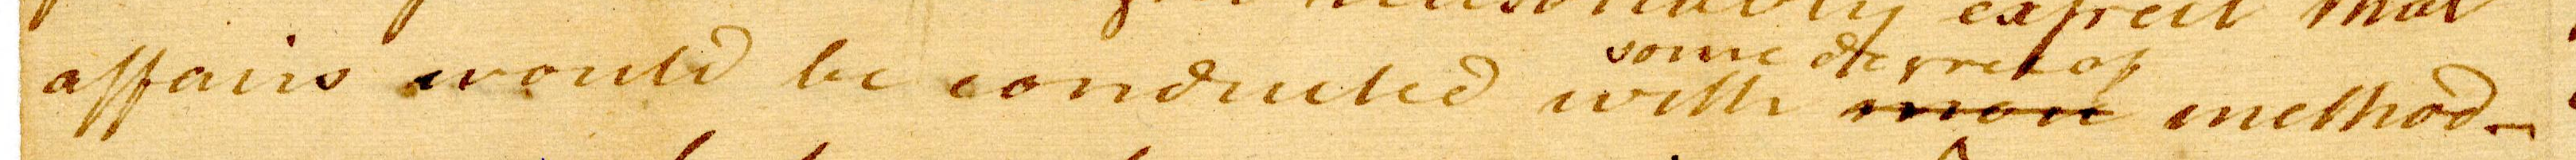affairs would be conducted with [more] method-
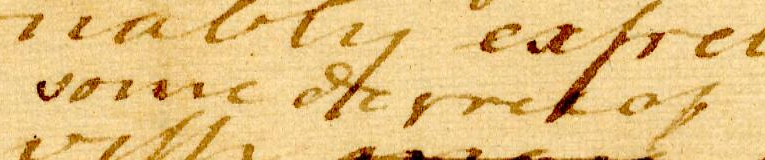some degree of
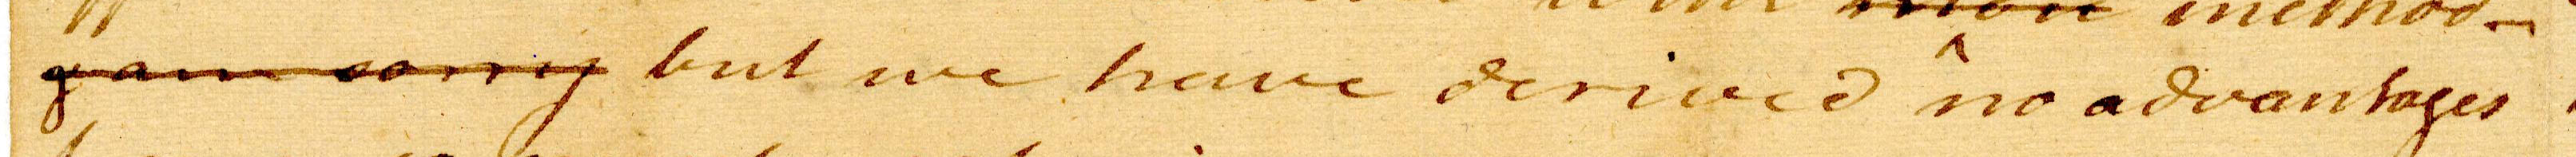[& am sorry] but we have derived no advantages
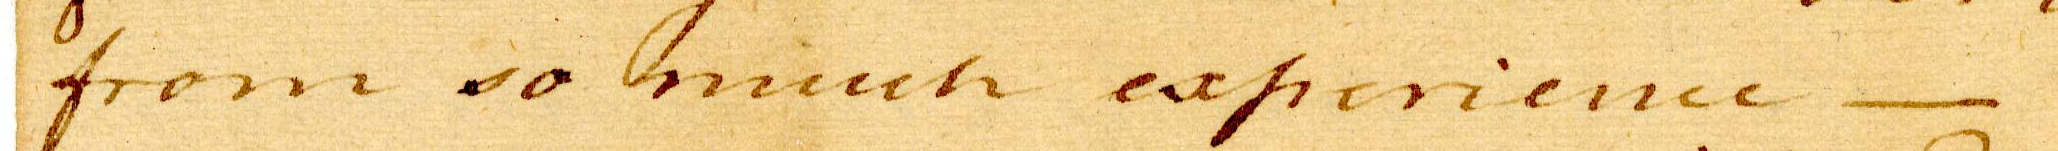from so much experience-
